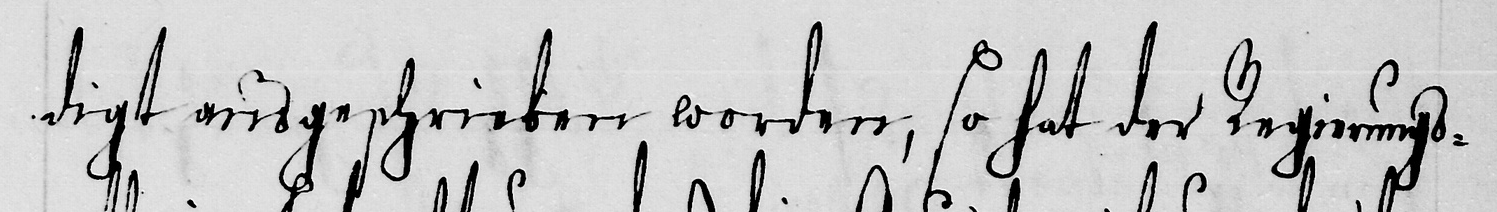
digt ausgeschrieben worden, so hat der Regierungs¬
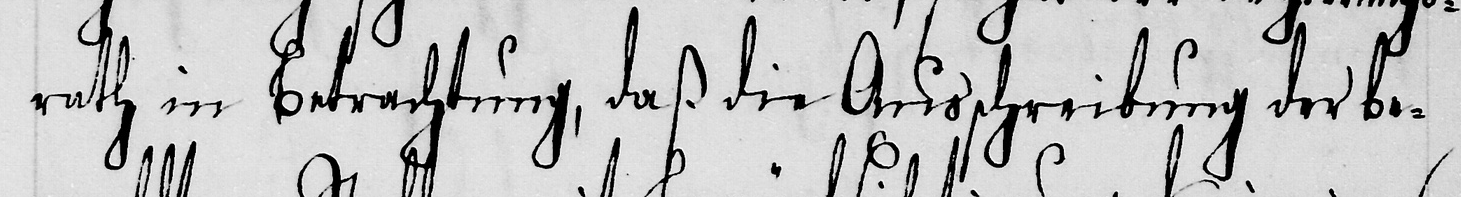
rath in Betrachtung, daß die Ausschreibung der be¬
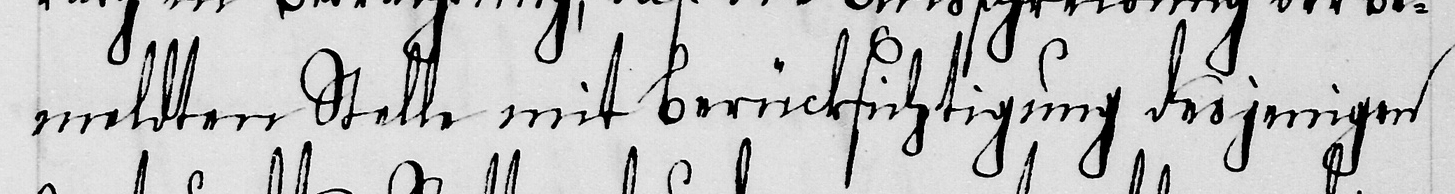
meldten Stelle mit Berücksichtigung desjenigen
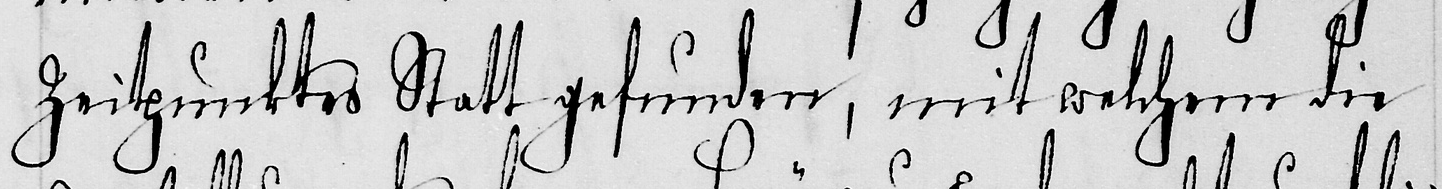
Zeitpunktes Statt gefunden, mit welchem die
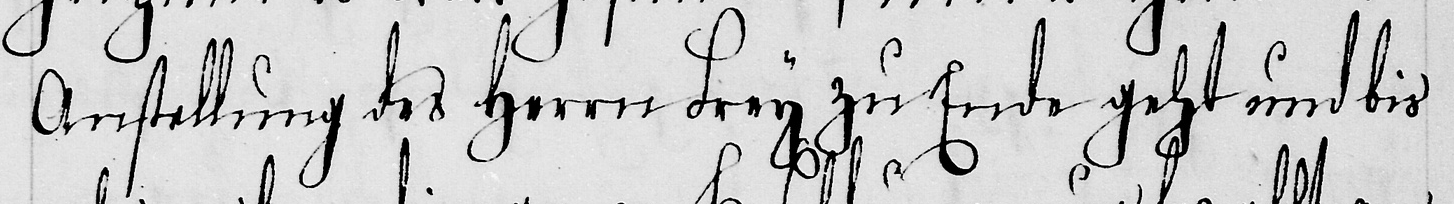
Anstellung des Herrn Frey zu Ende geht und bis
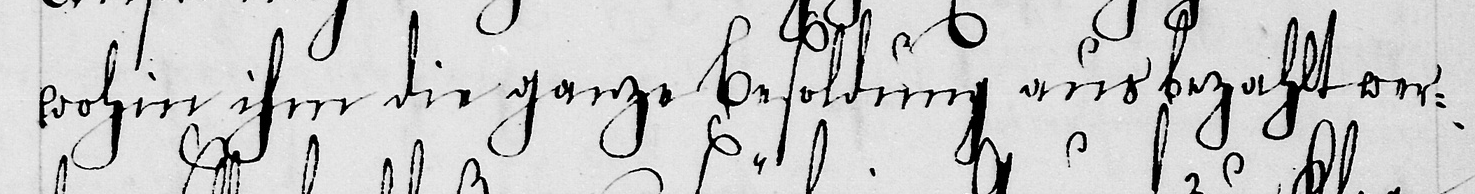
wohin ihm die ganze Besoldung ausbezahlt wer¬
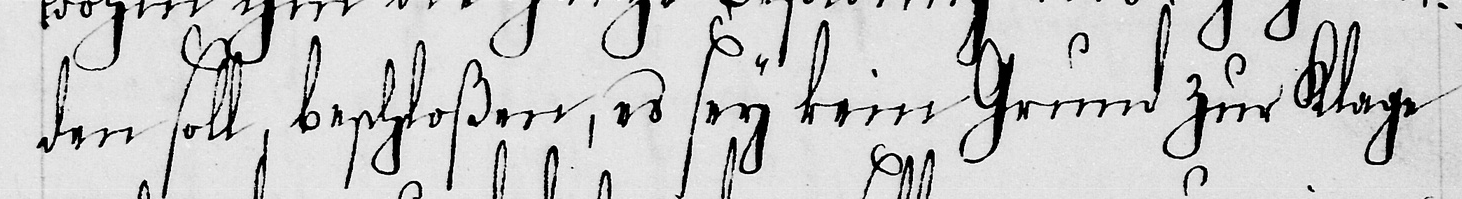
den soll, beschloßen, es sey kein Grund zur Klage
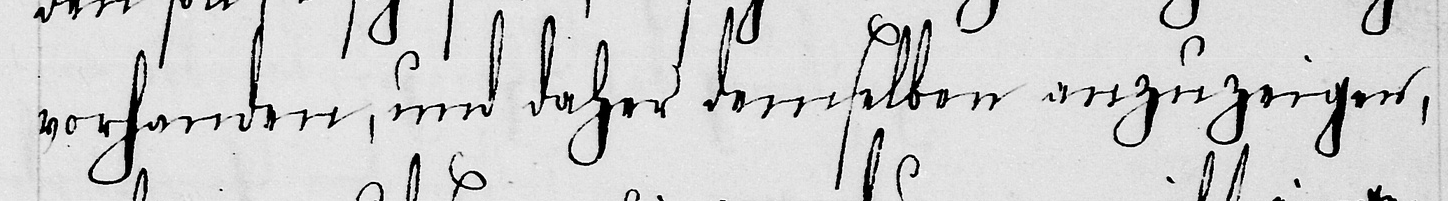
vorhanden, und daher demselben anzuzeigen,
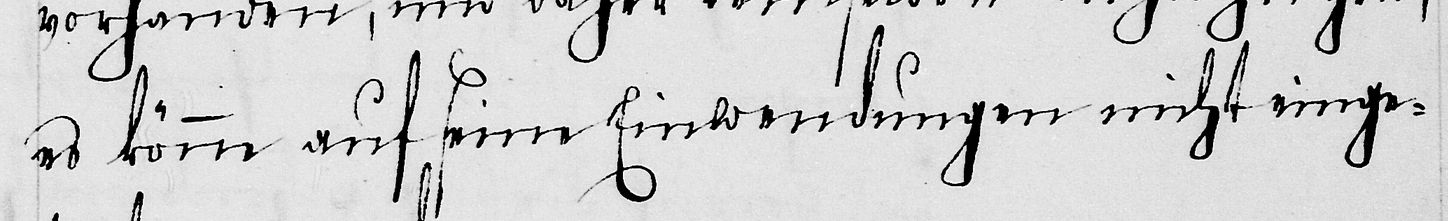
es könne auf seine Einwendungen nicht einge¬
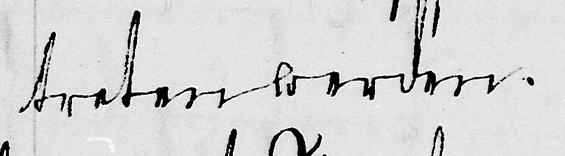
treten werden.
